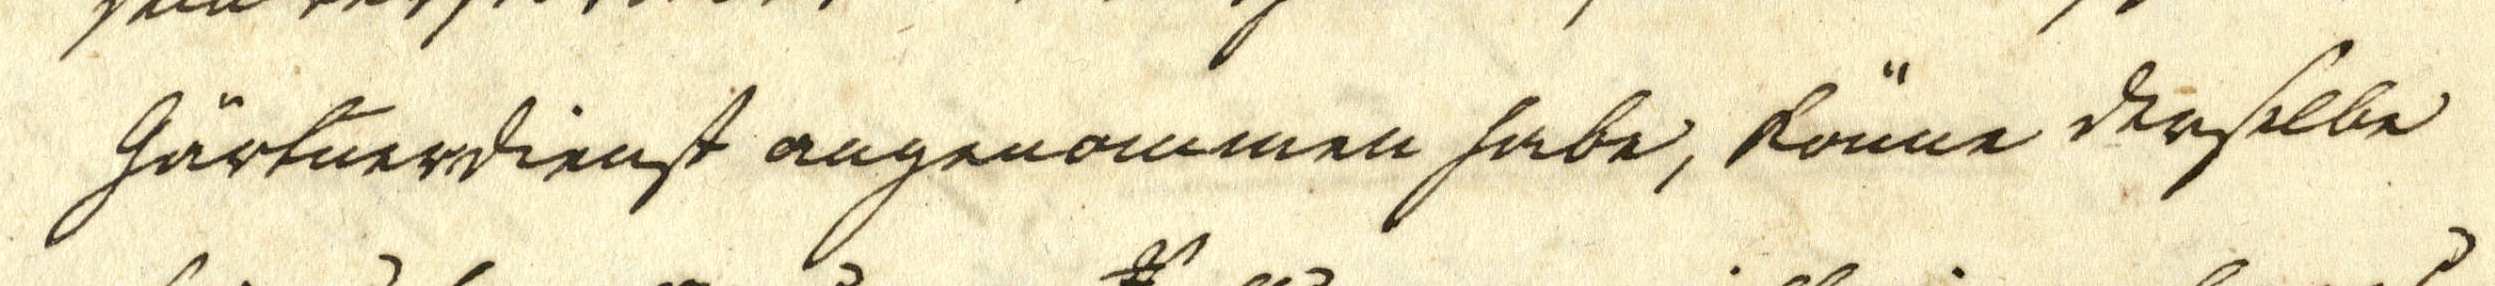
Gärtnerdienst angenommen habe, könne derselbe
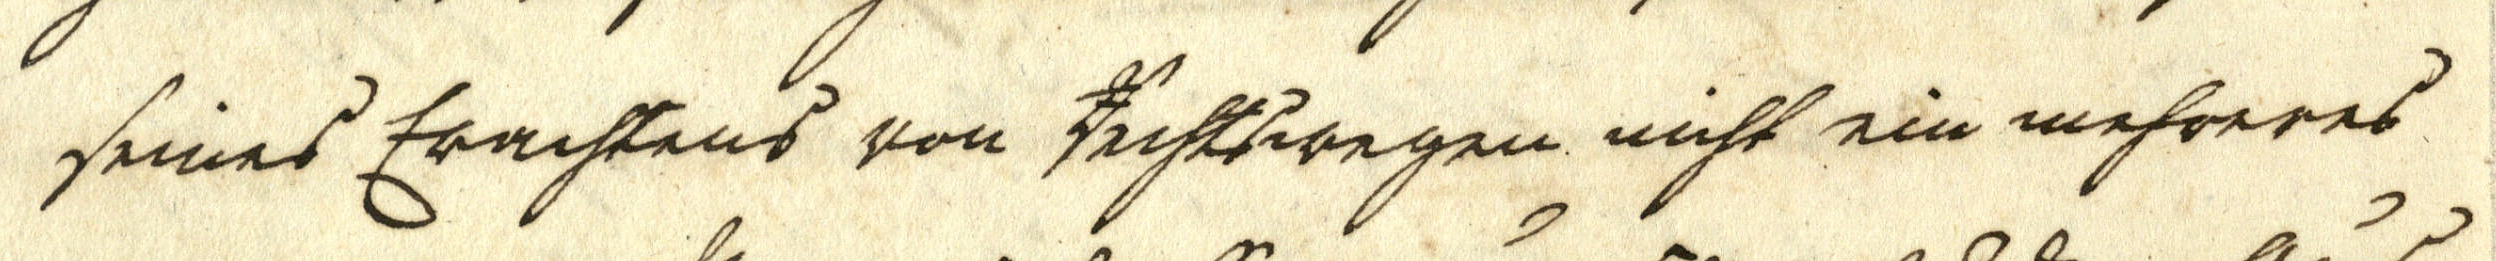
seines Erachtens von Rechtswegen nicht ein mehreres
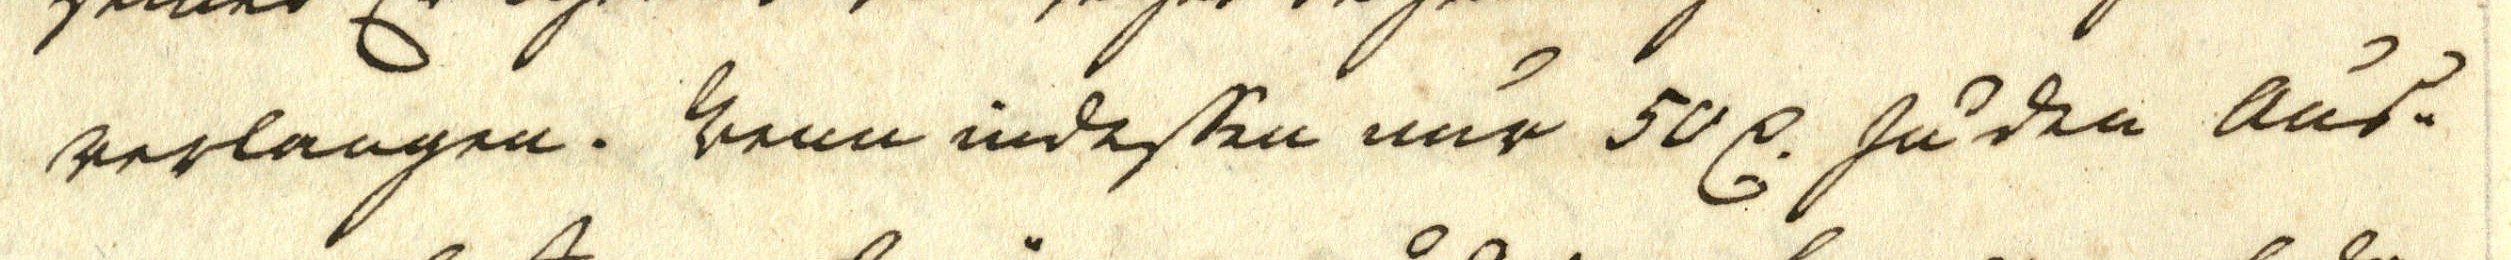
verlangen. Wenn indessen nur 50 l. zu den Aus¬
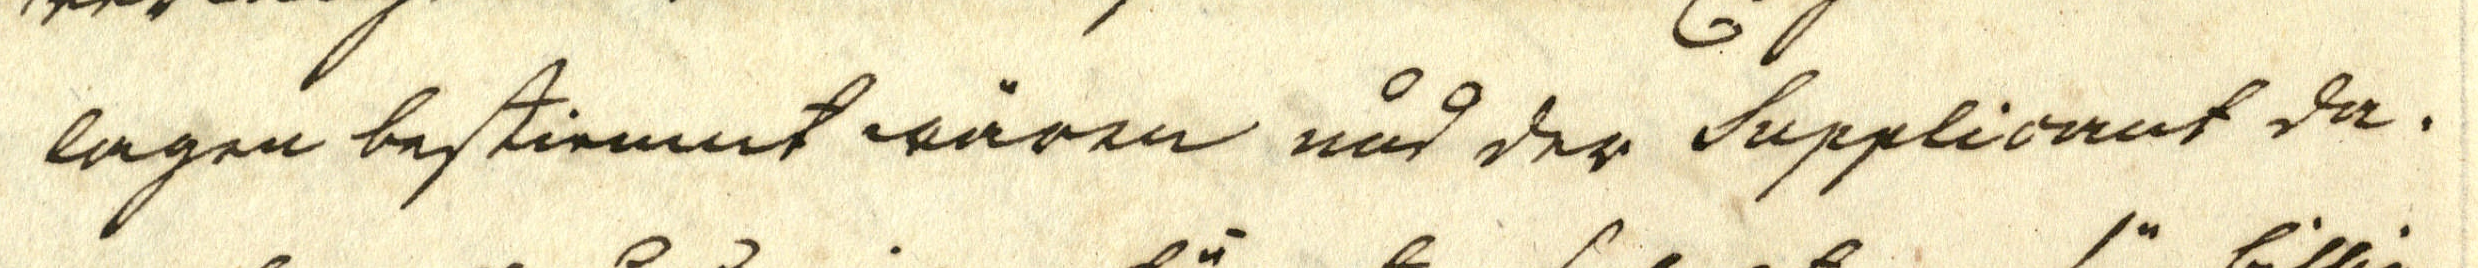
lagen bestimmt wären und der Supplicant da¬
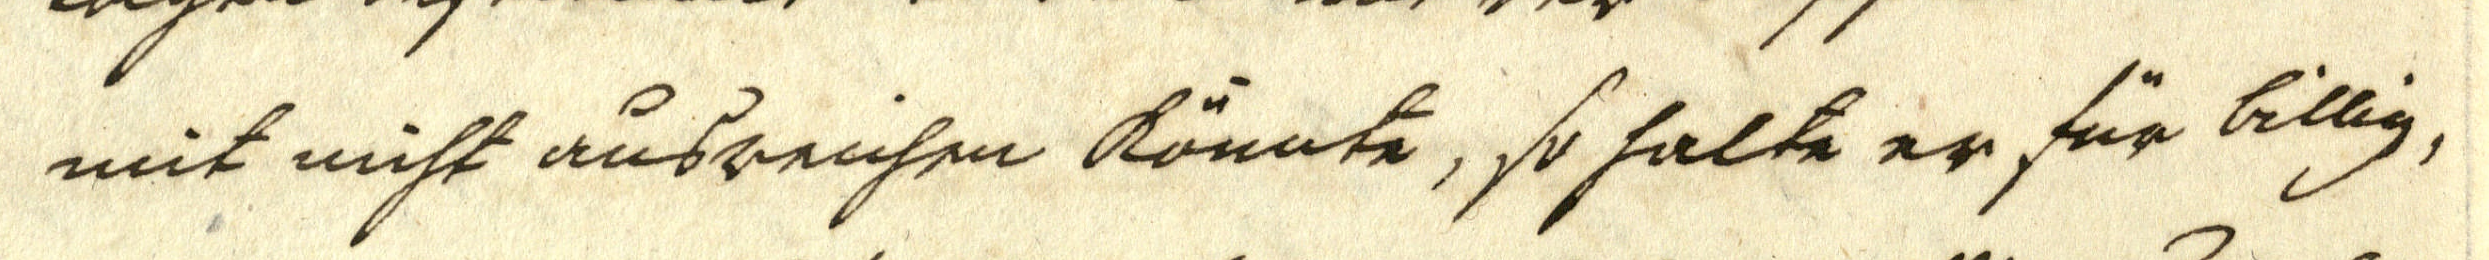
mit nicht ausreichen könnte, so halte er für billig,
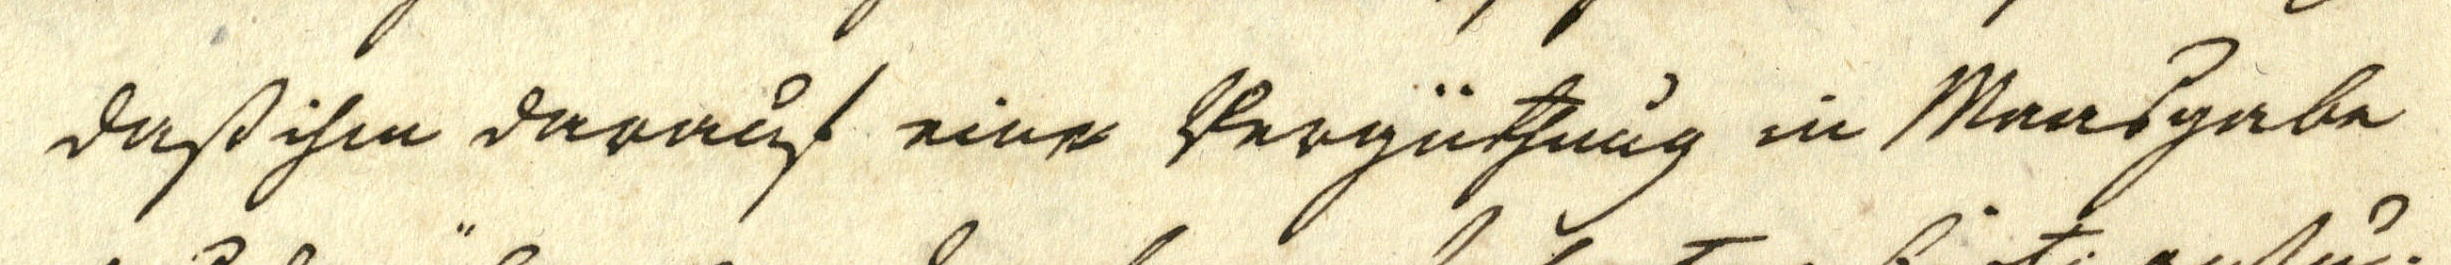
daß ihm darauf eine Vergüthung in Maasgabe
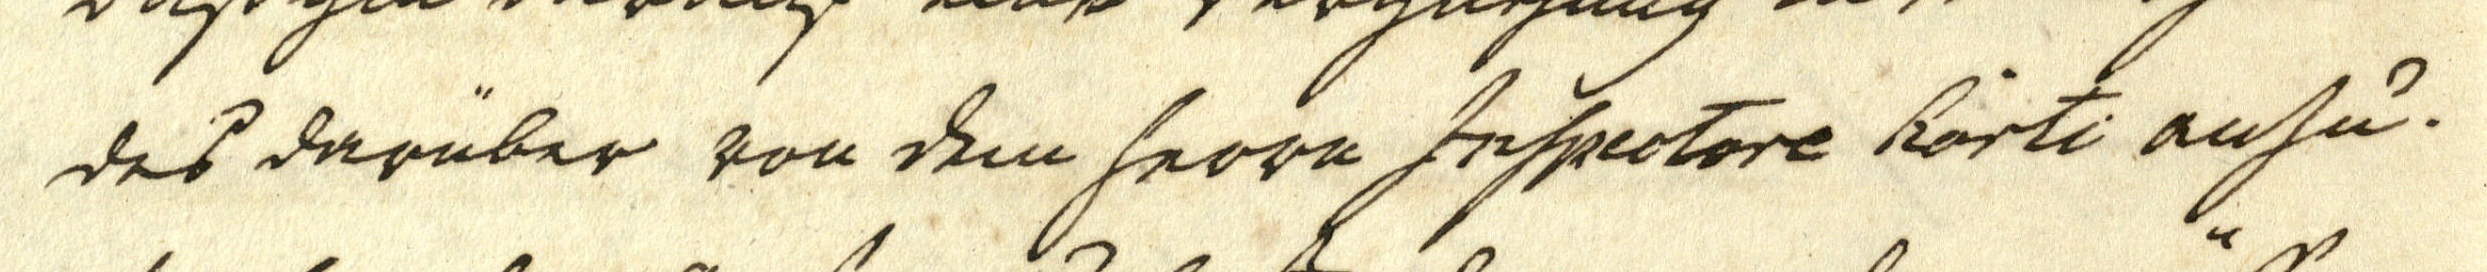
des darüber von dem Herrn Insprectore horti anzu¬
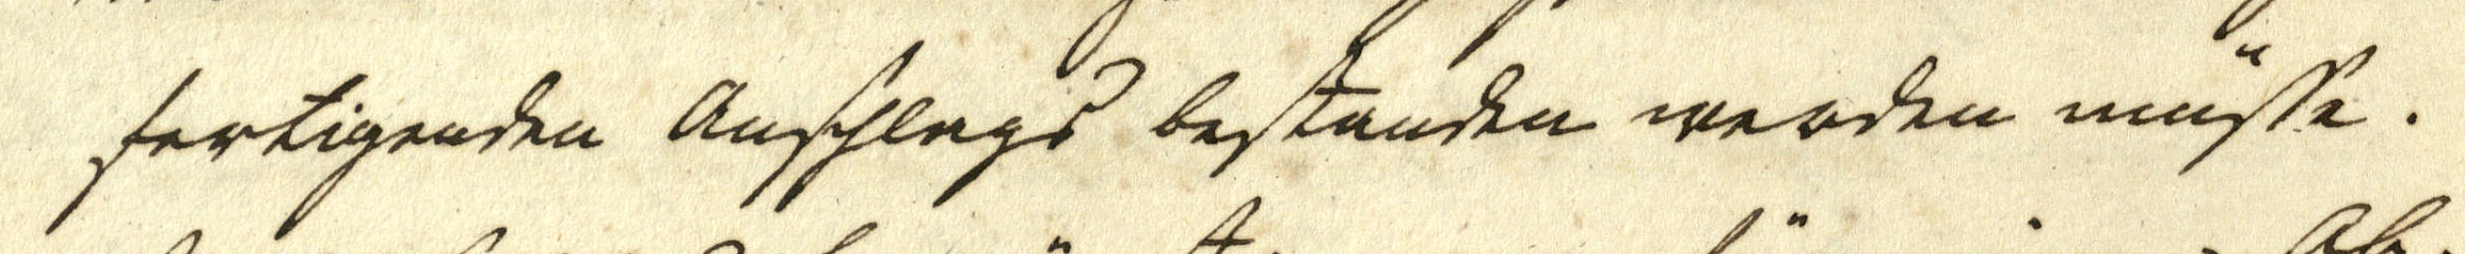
fertigenden Anschlags bestanden werden müsse.
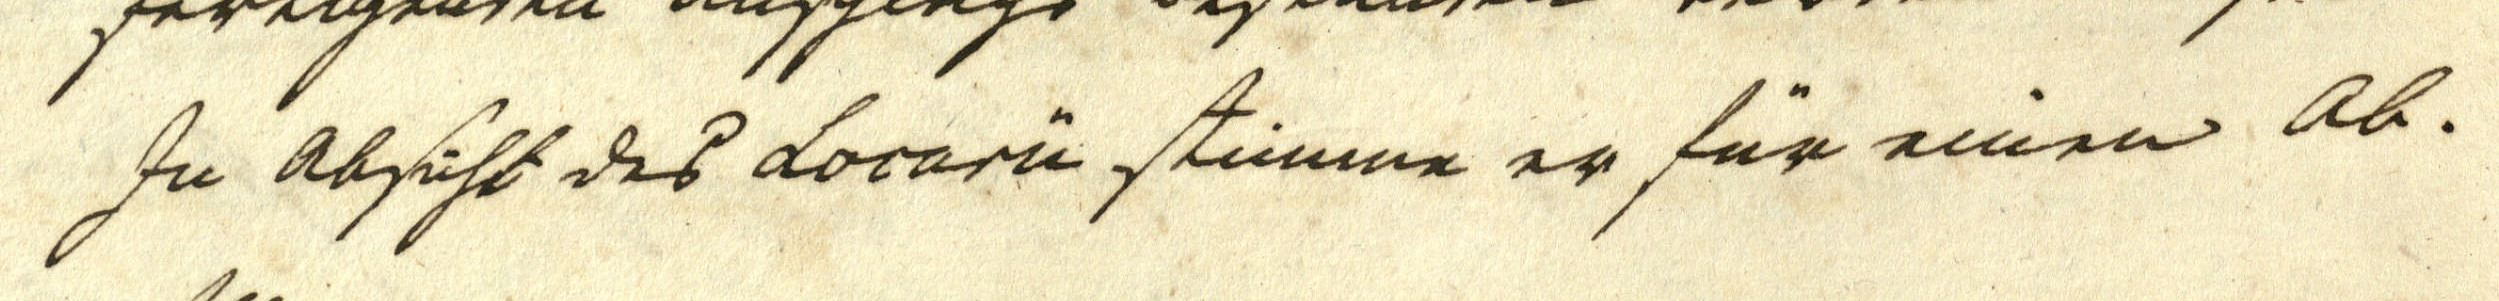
In Absicht des Locarii stimme er für einen Ab¬
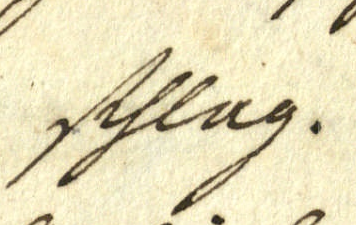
schlag.
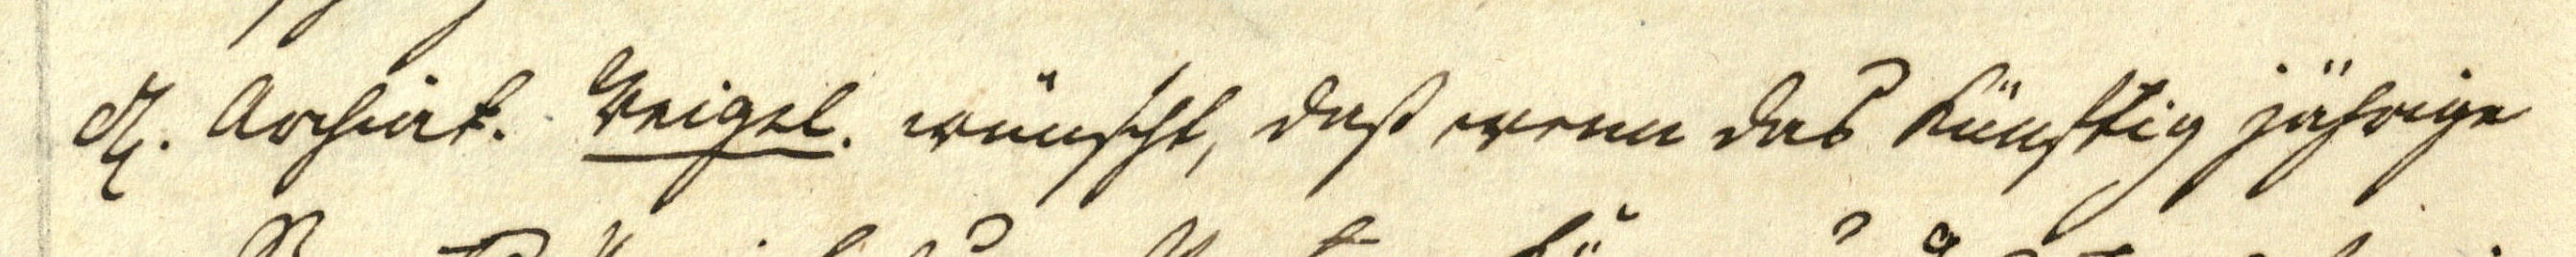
dh. Archiat. Weigel. wünscht, daß wenn das künftig jährige
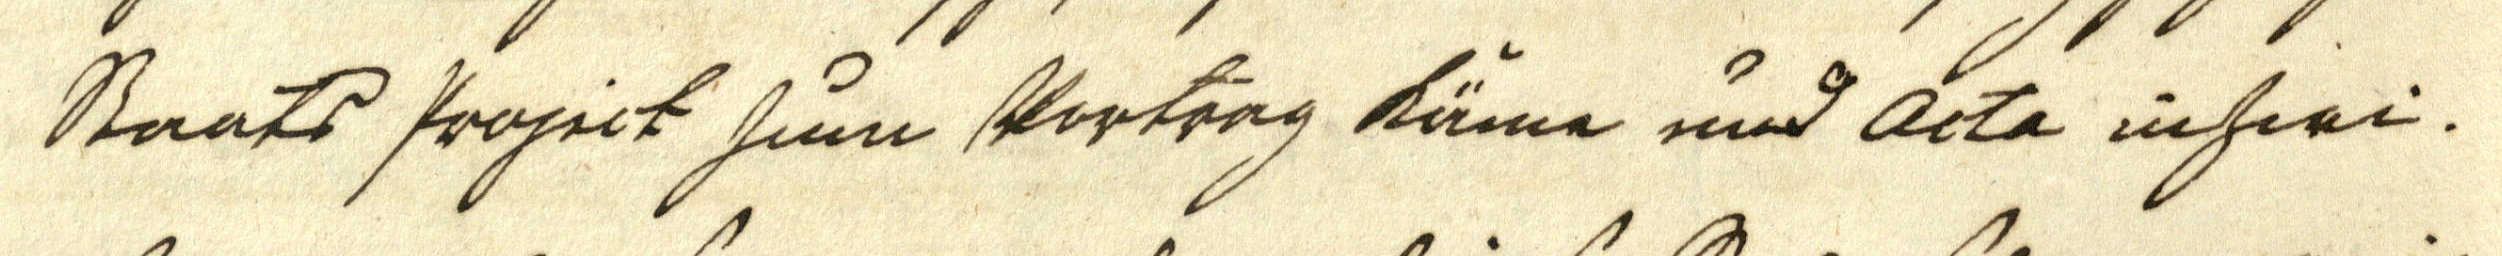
Staats Project zum Vortrag käme und Acta inzwi¬
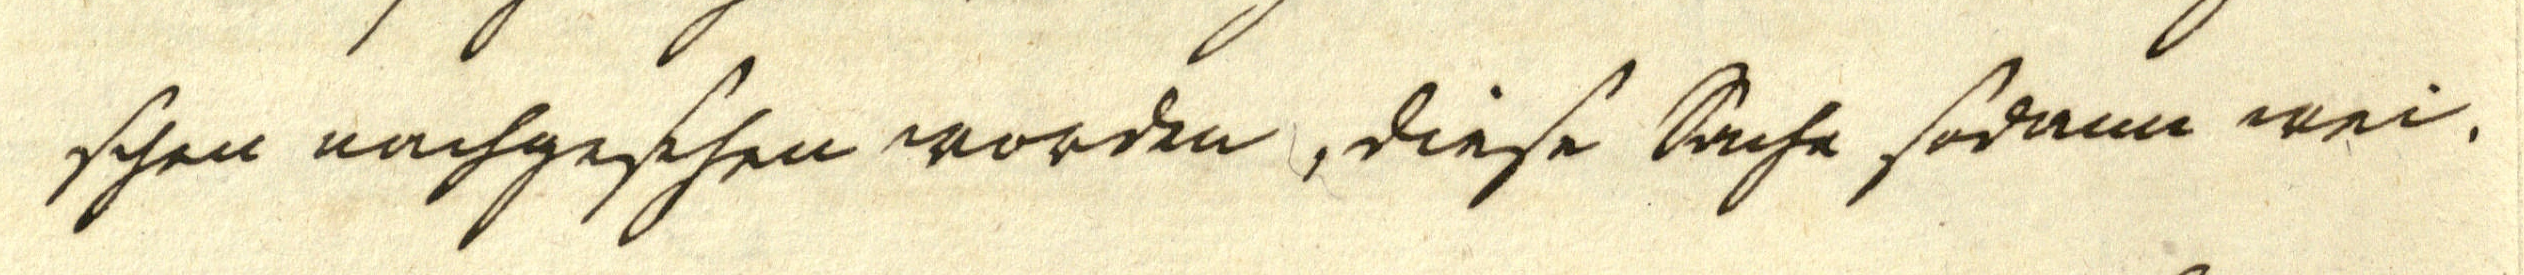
schen nachgesehen worden, diese Sache sodann wei¬
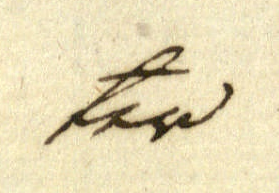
ter
